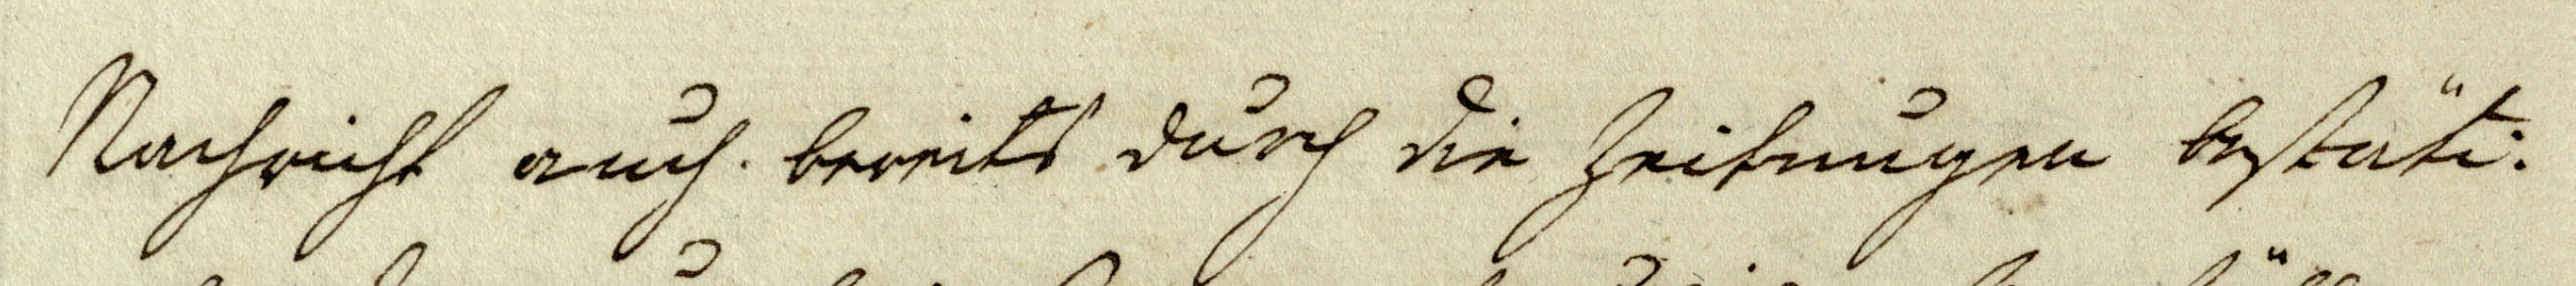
Nachricht auch bereits durch die Zeitungen bestäti
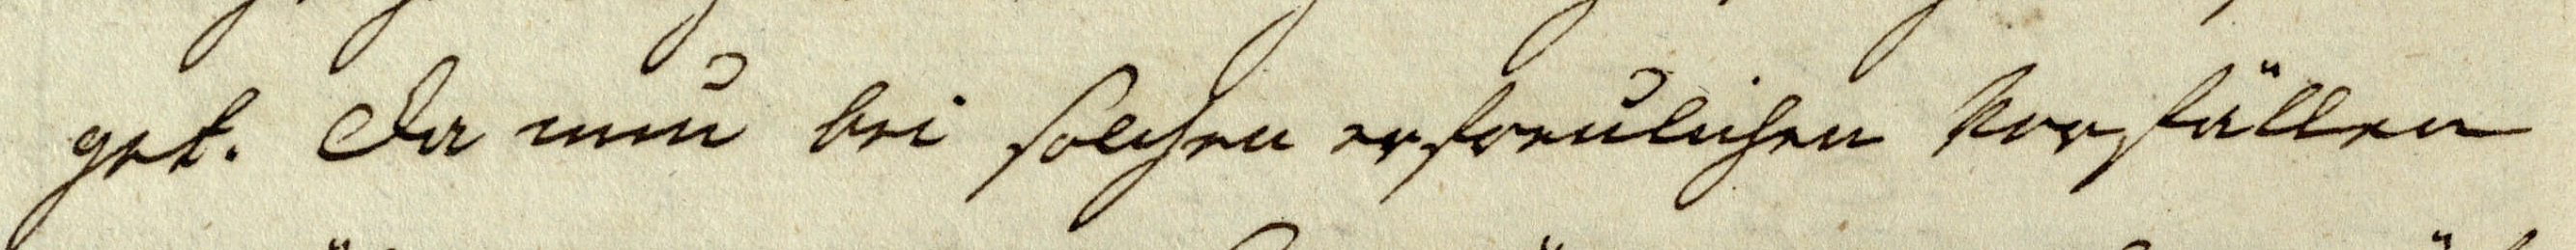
get. Da nun bei solchen erfreulichen Vorfällen
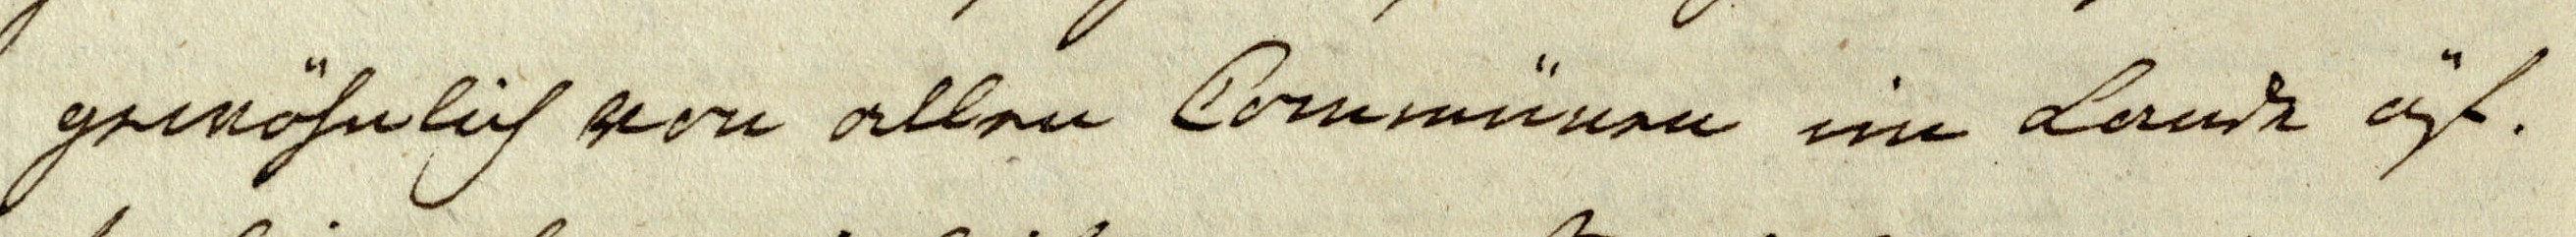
gewöhnlich von allen Commünen im Lande öf¬
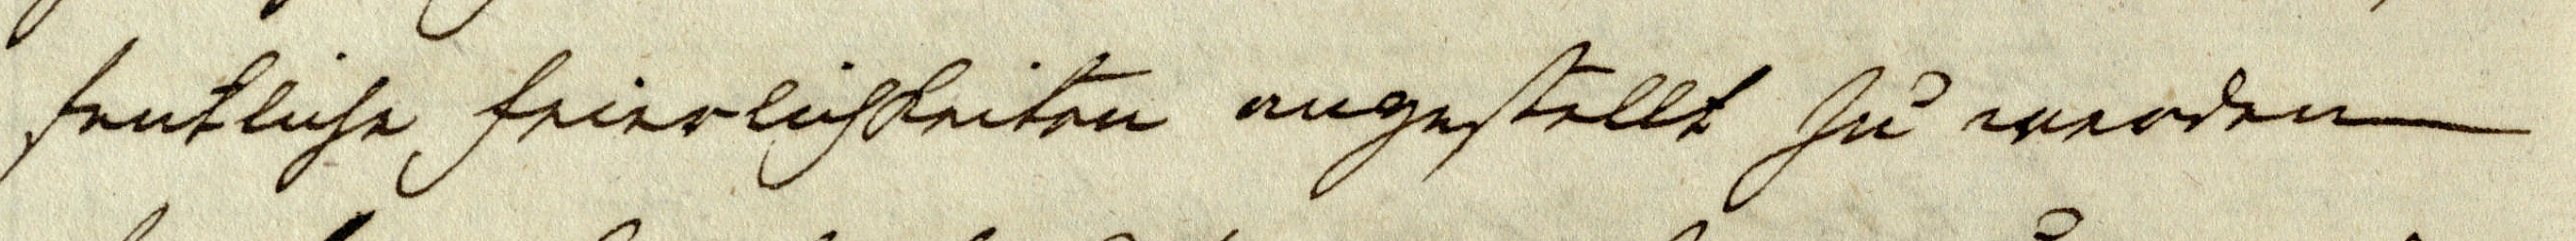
fentliche Feierlichkeiten angestellt zu werden
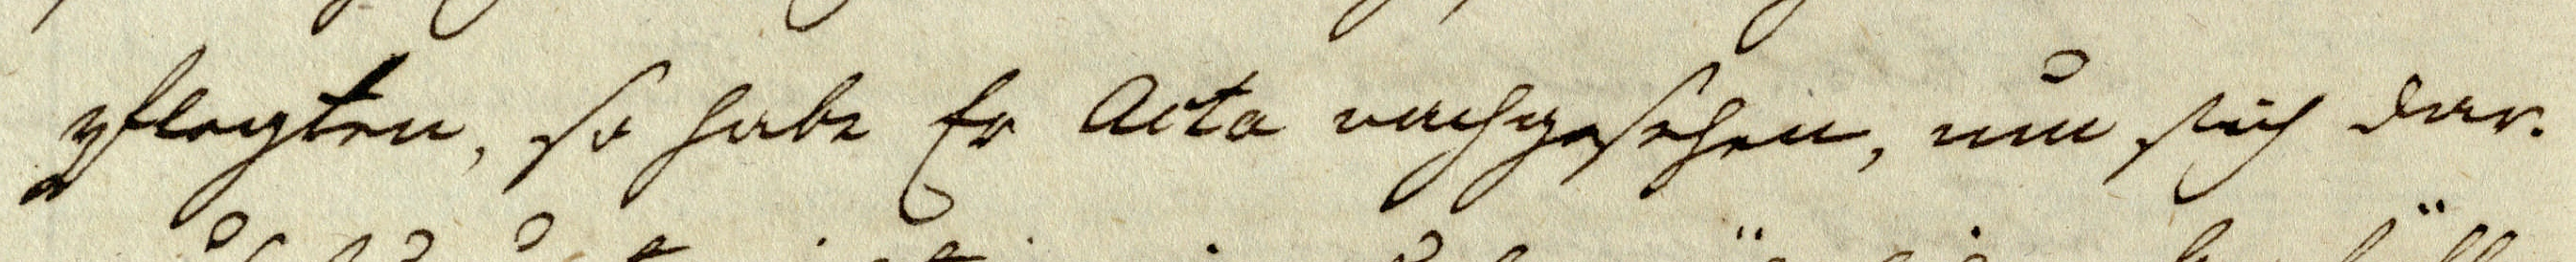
pflegten, so habe Er Acta nachgesehen, um sich dar¬
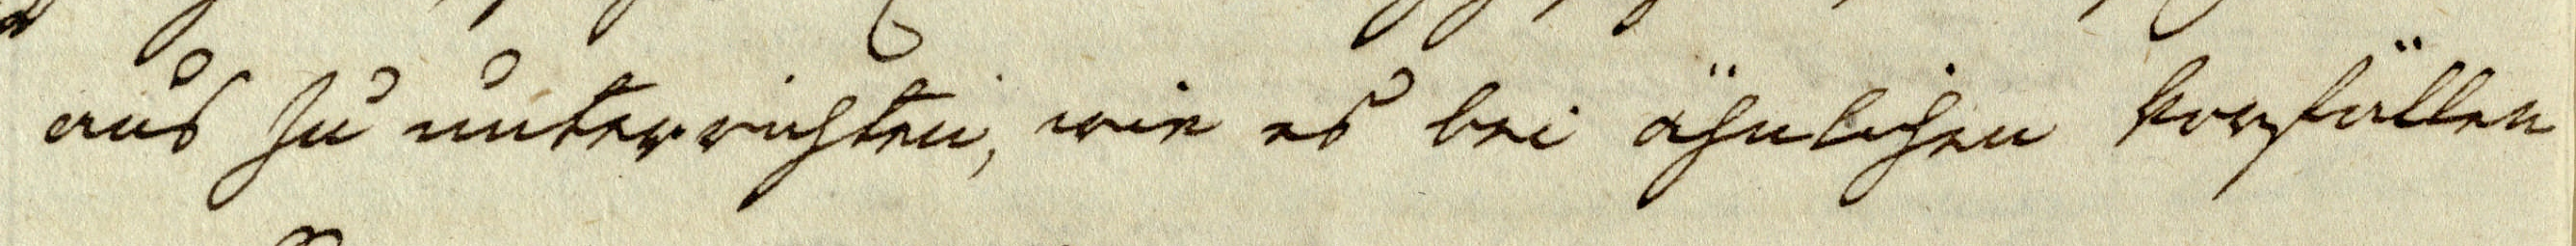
aus zu unterrichten, wie es bei ähnlichen Vorfällen
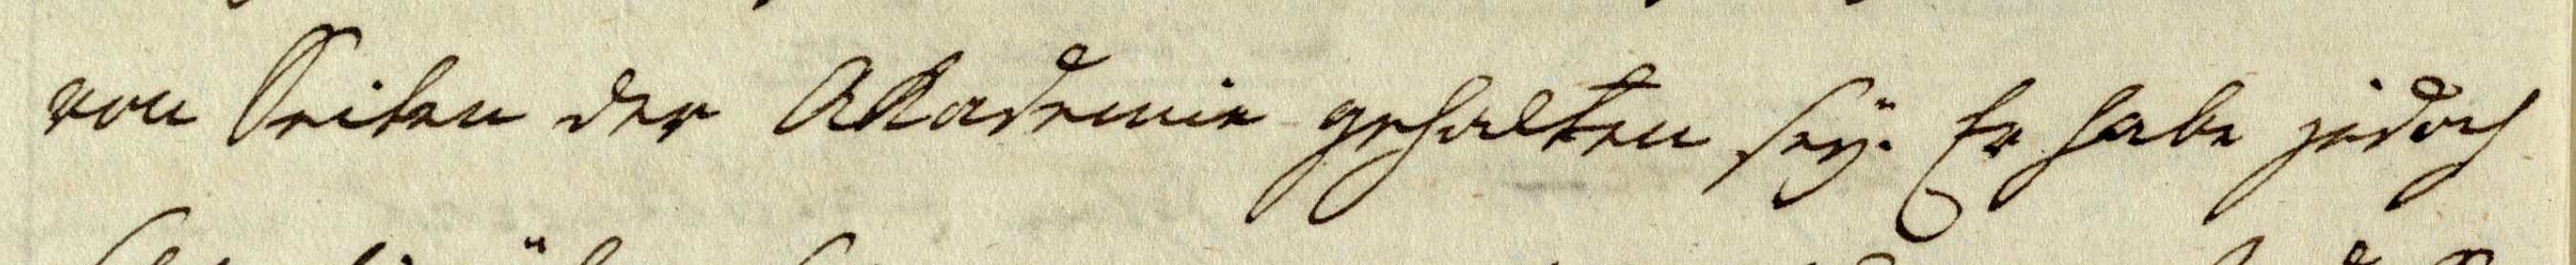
von Seiten der Akademie gehalten seÿ. Er habe jedoch
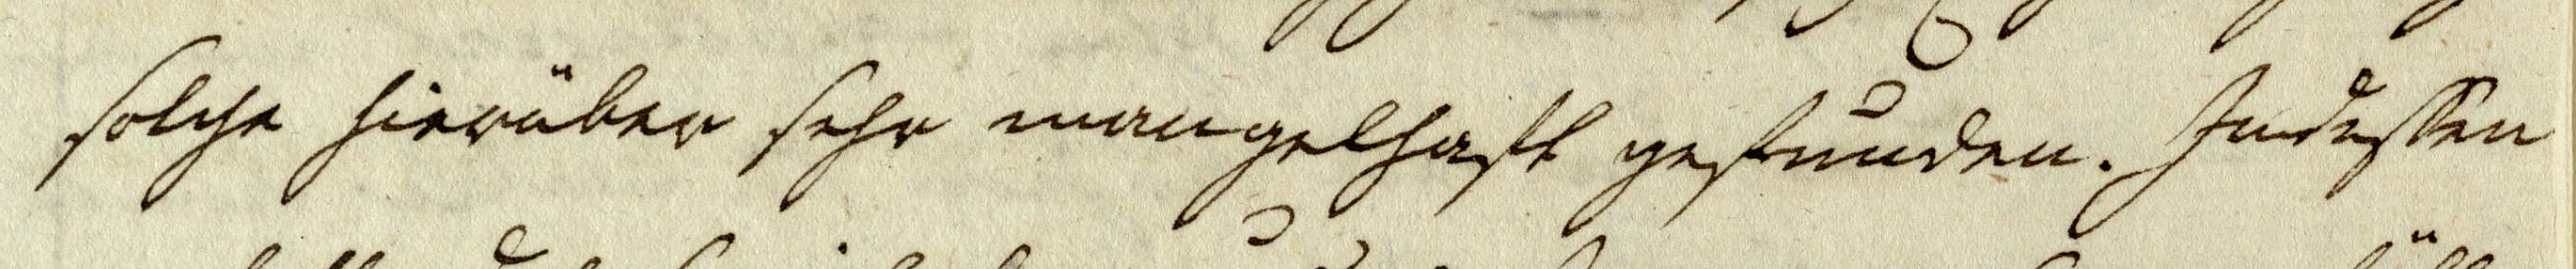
solche hierüber sehr mangelhaft gefunden. Indessen
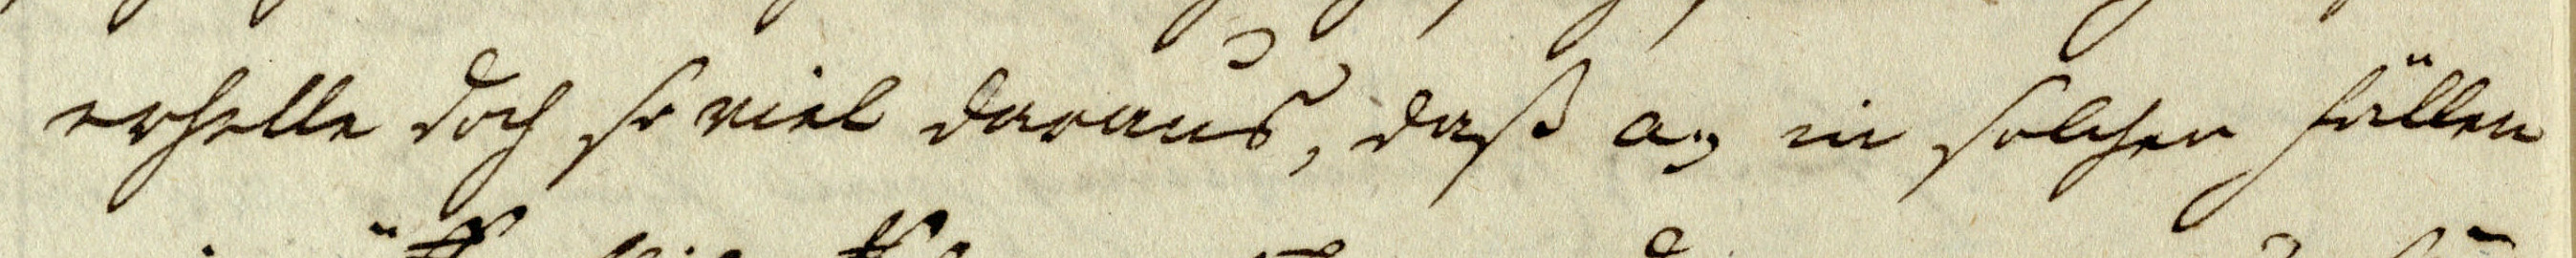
erhelle doch so viel daraus, daß a., in solchen Fällen
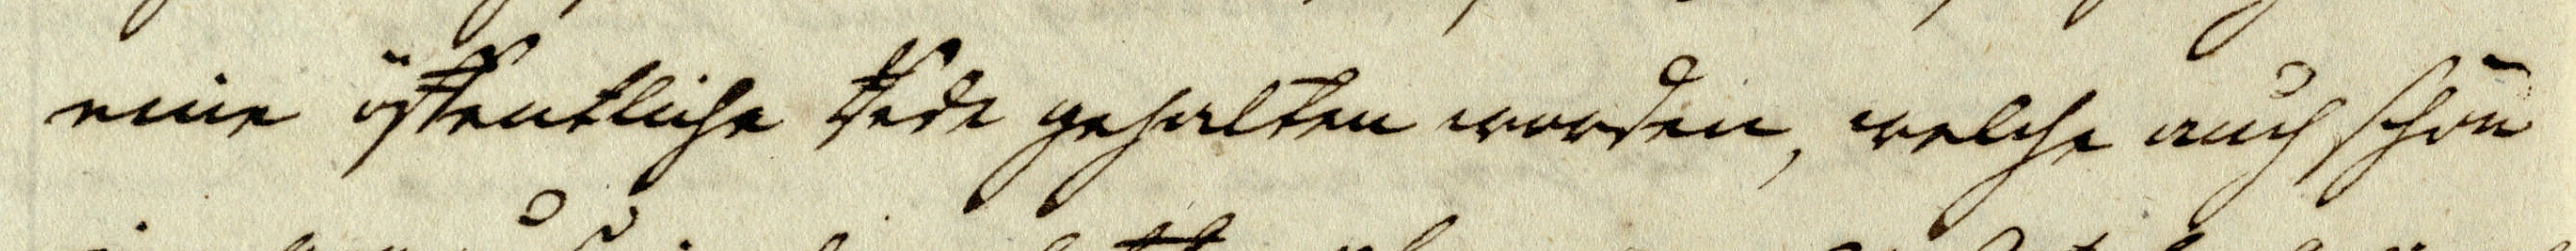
eine öffentliche Rede gehalten worden, welche auch schon
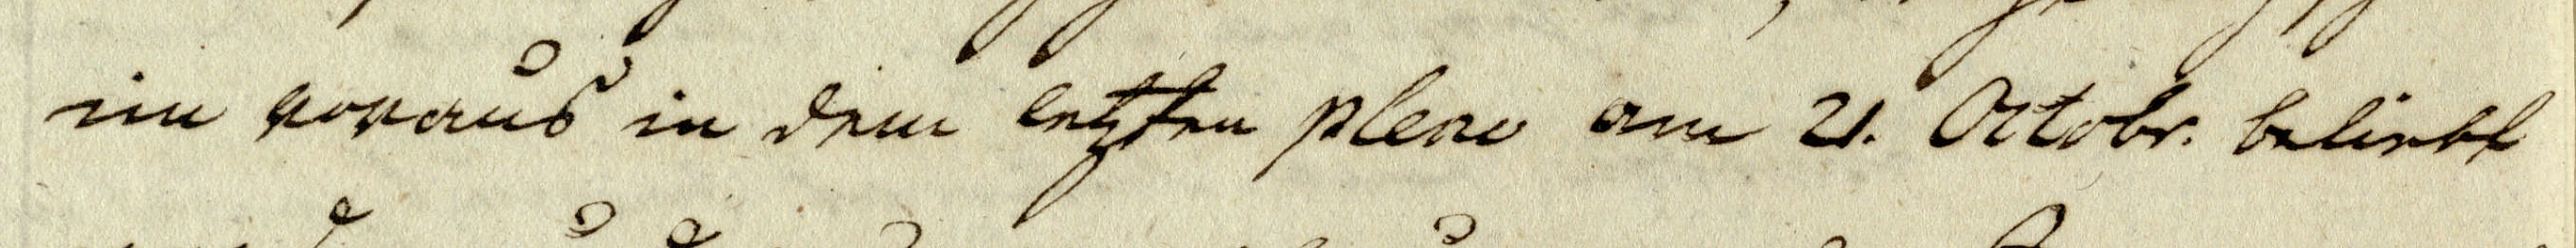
im voraus in dem letzten pleno am 21. Octobr beliebt
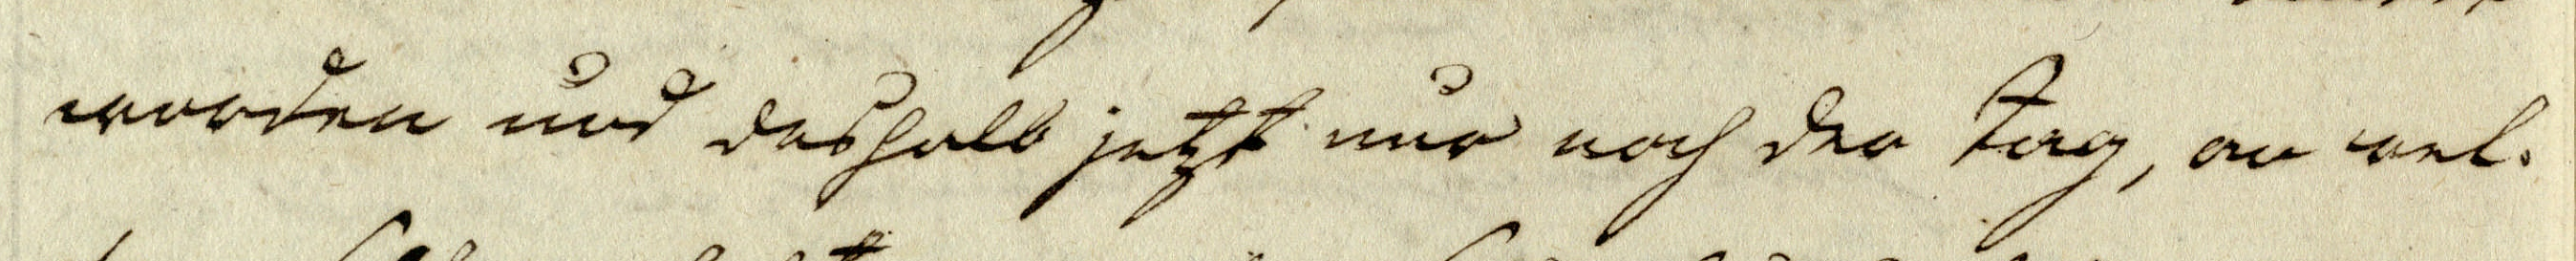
worden und deshalb jetzt nur noch der Tag, an wel¬
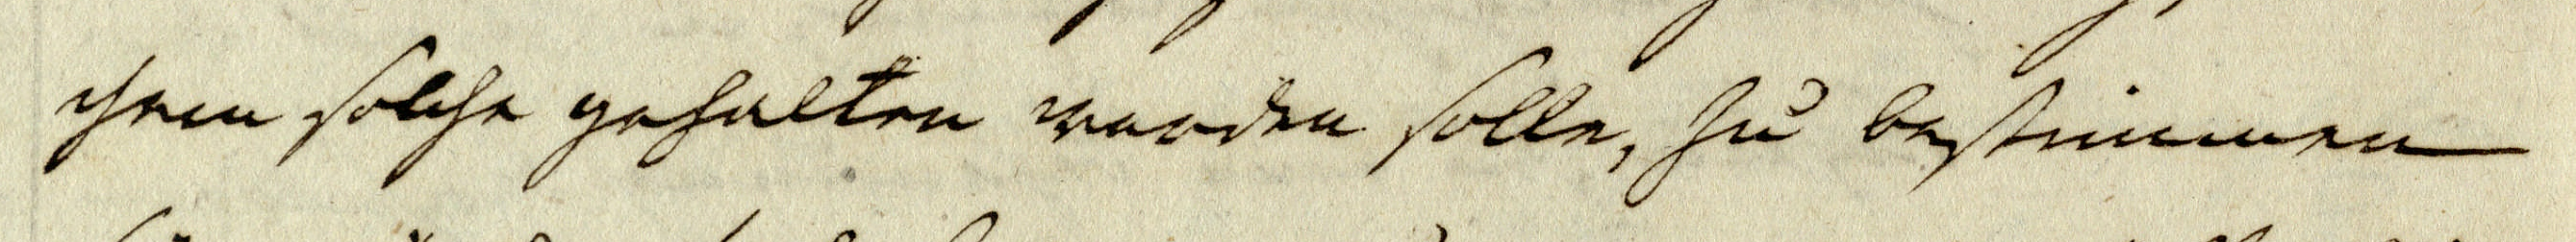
chem solche gehalten werden solle, zu bestimmen
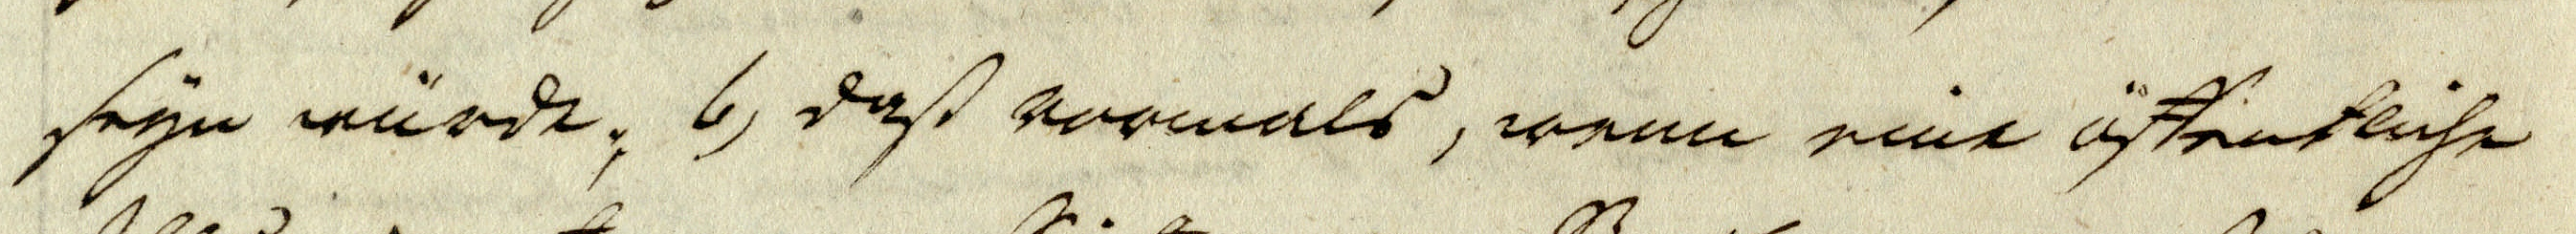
seÿn würde; b., daß vormals, wenn eine öffentliche
